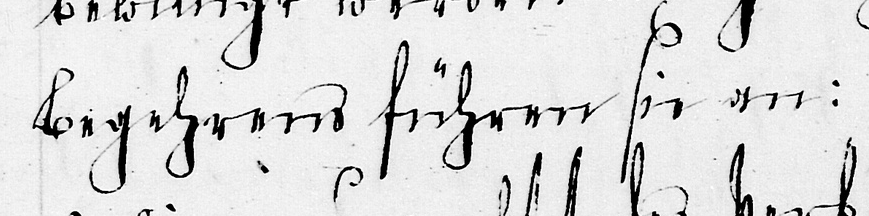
Begehrens führen sie an:
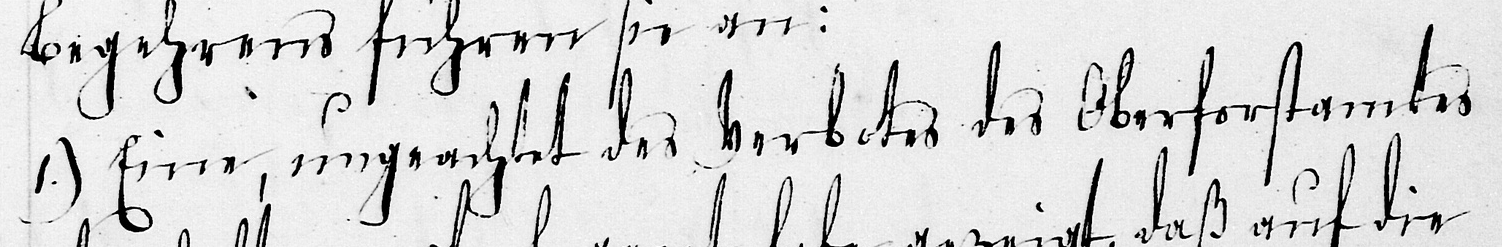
1.) Eine, ungeachtet des Verbotes des Oberforstamtes
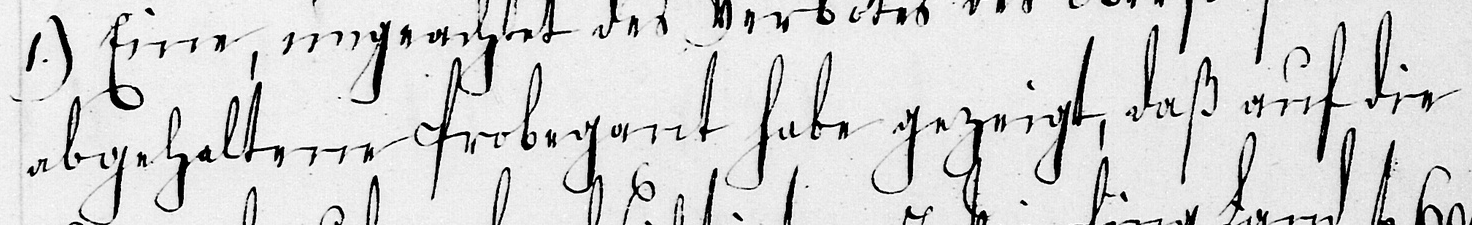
abgehaltene Probegant habe gezeigt, daß auf die
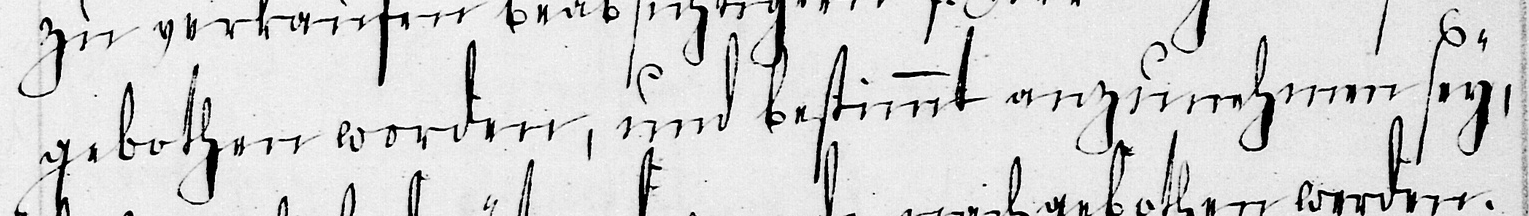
gebothen worden, und bestimmt anzunehmen sey,
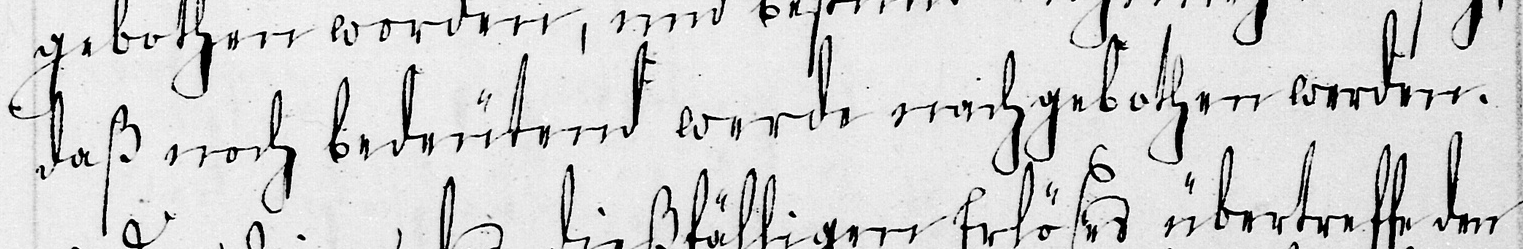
daß noch bedeutend werde nachgebothen werden.
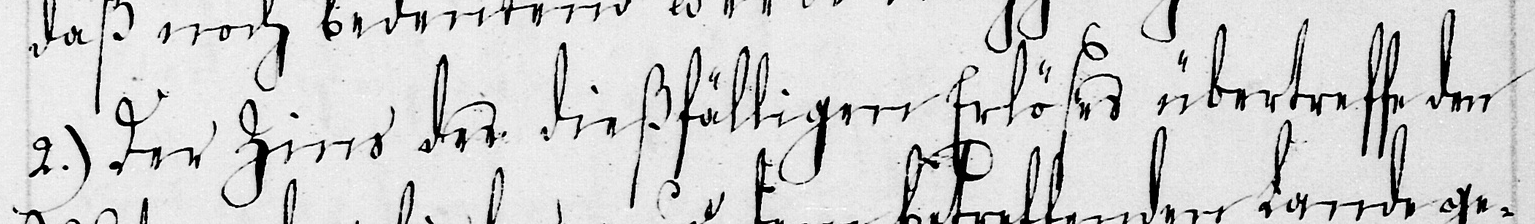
2.) Der Zins des dießfälligen Erlöses übertreffe den
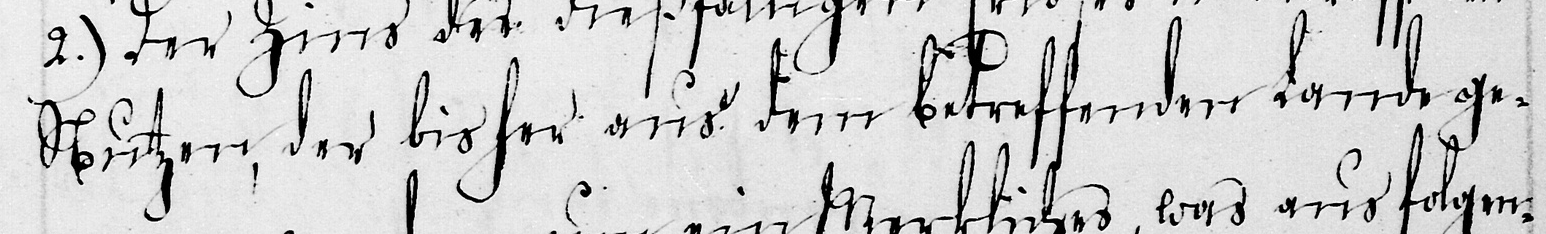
Nutzen, der bisher aus dem betreffenden Lande ge¬
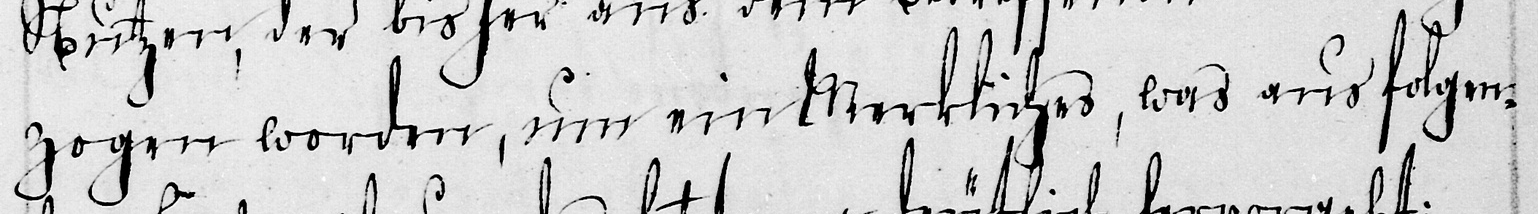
zogen worden, um ein Merkliches, was aus folgen¬
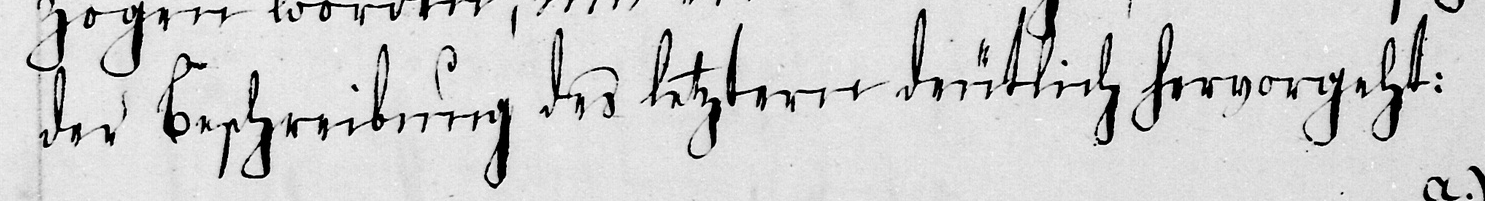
der Beschreibung des letztern deutlich hervorgeht:
